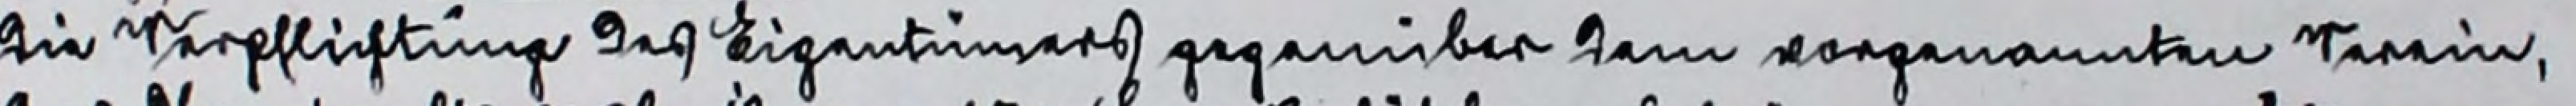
die Verpflichtung des Eigentümers gegenüber dem vorgenannten Verein,
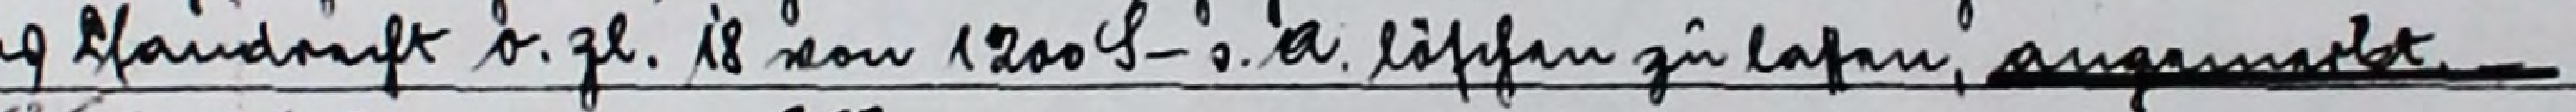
das Pfandrecht v. Zl. 18 von 1200 S - s.A. löschen zu lassen, angemerkt.
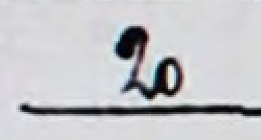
20
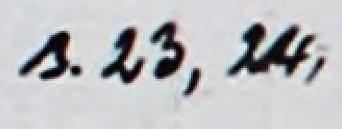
s. 23, 24,
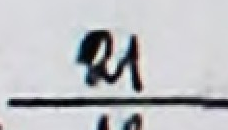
21
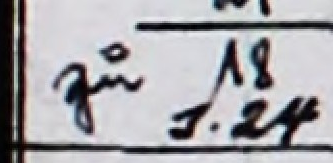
zu 18
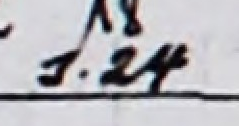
s. 24
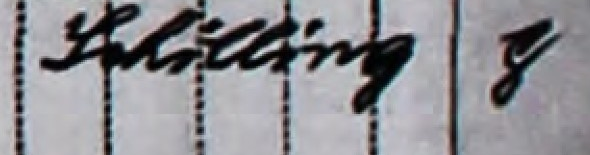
Schilling G
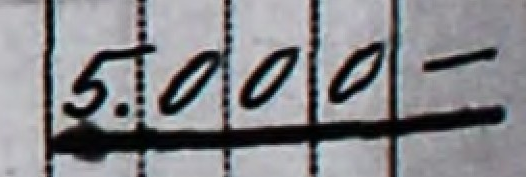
5.000 –
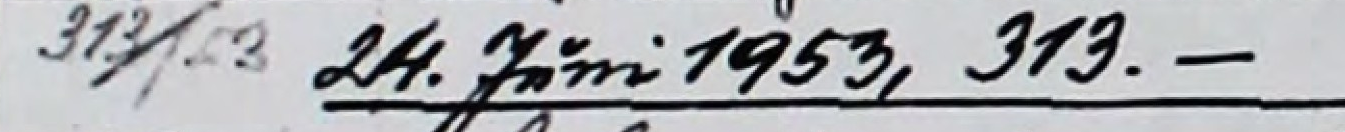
313/53 24. Juni 1953, 313.-
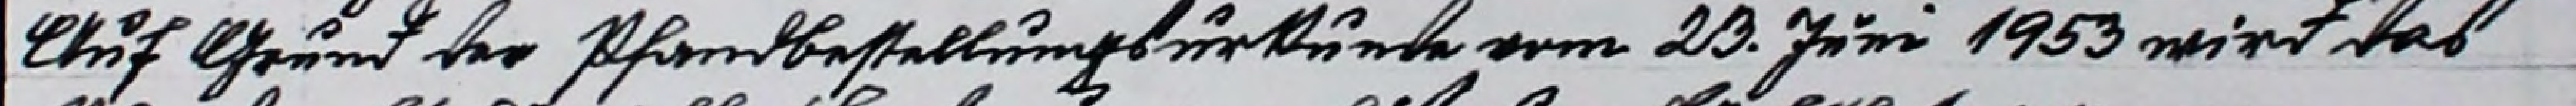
Auf Grund der Pfandbestellungsurkunde vom 23. Juni 1953 wird das
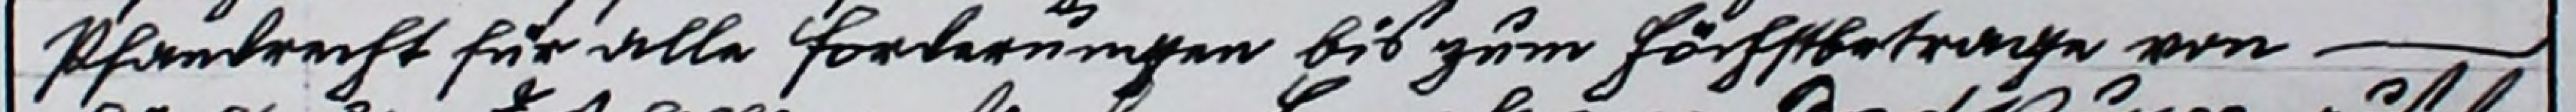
Pfandrecht für alle Forderungen bis zum Höchstbetrage von
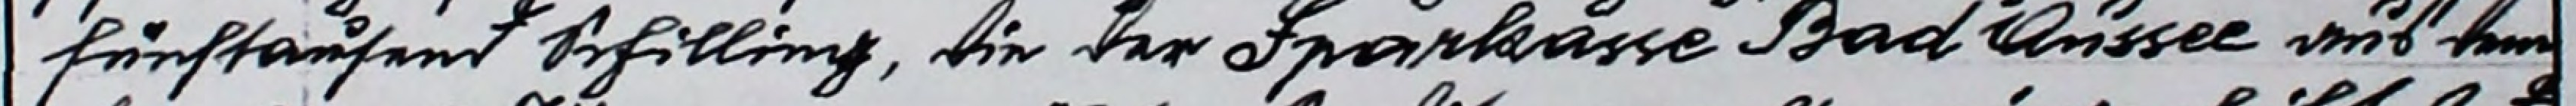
Fünftausend Schilling, die der Sparkasse Bad Aussee aus dem
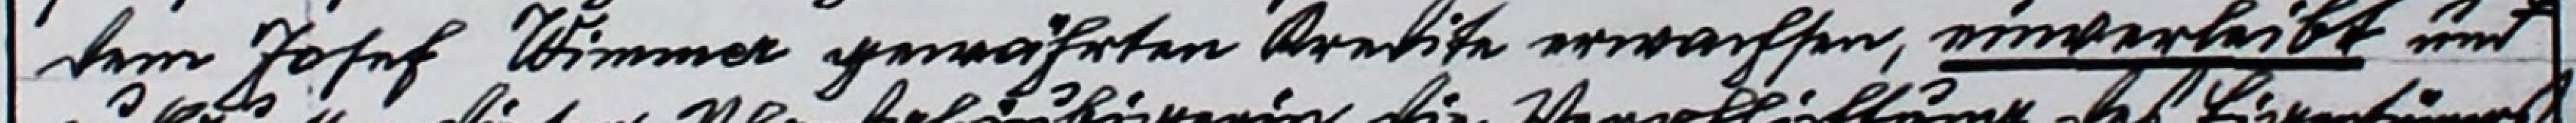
dem Josef Wimmer gewährten Kredite erwachsen, einverleibt und
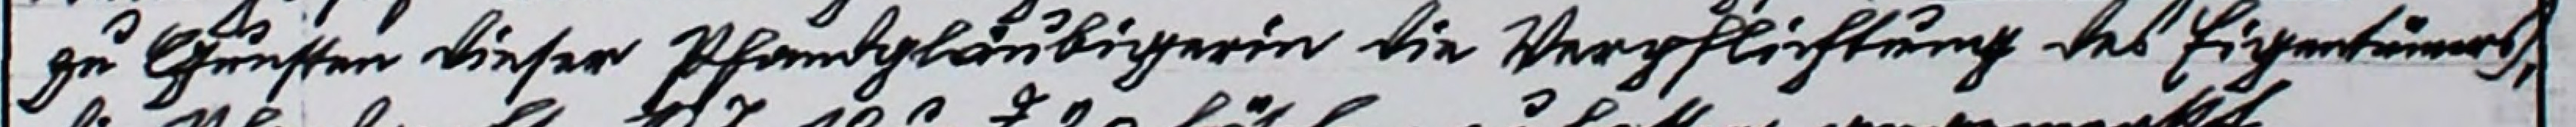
zu Gunsten dieser Pfandgläubigerin die Verpflichtung des Eigentümers,
